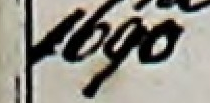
1690
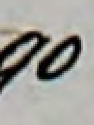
90
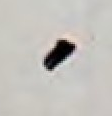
„
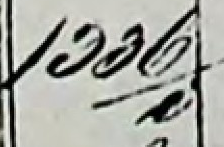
1336/c
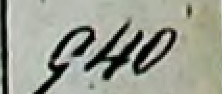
940
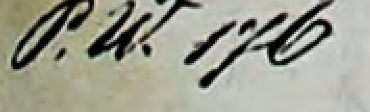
P.W. 176
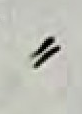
„
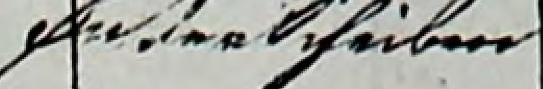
Bei der Schreiben
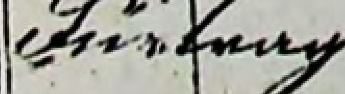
Fürtag
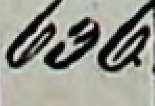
636
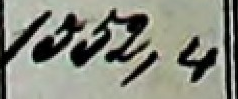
1552,4
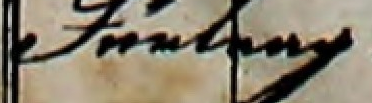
Fürtrag
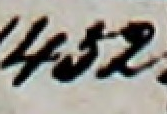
1452
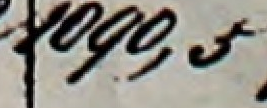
1090,5
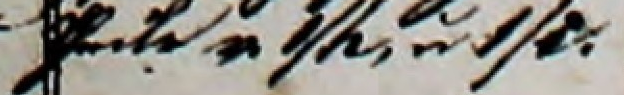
Theile v 1/h, u 1/i
